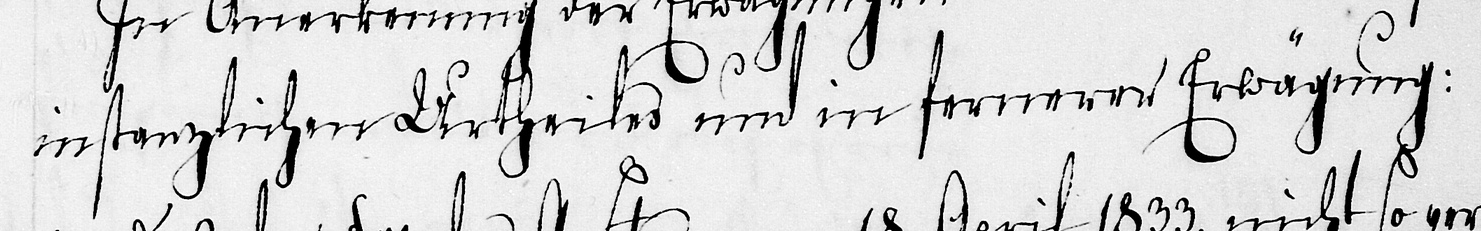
instanzlichen Urtheiles und in fernerer Erwägung:
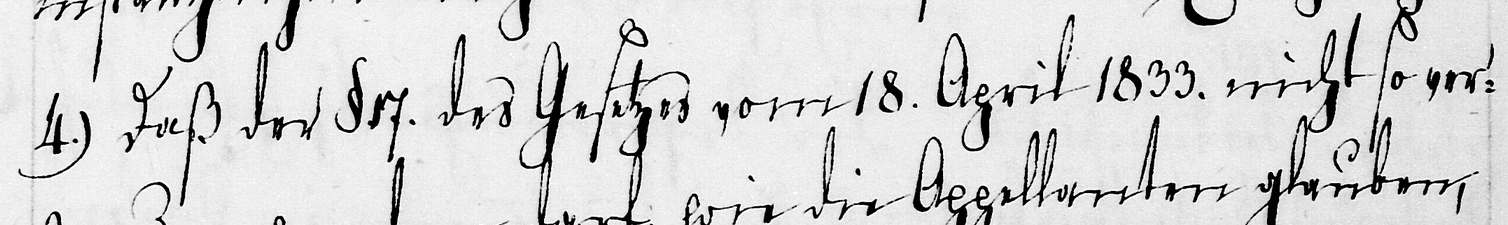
4.) Daß der §. 17. des Gesetzes vom 18. April 1833. nicht so ver¬
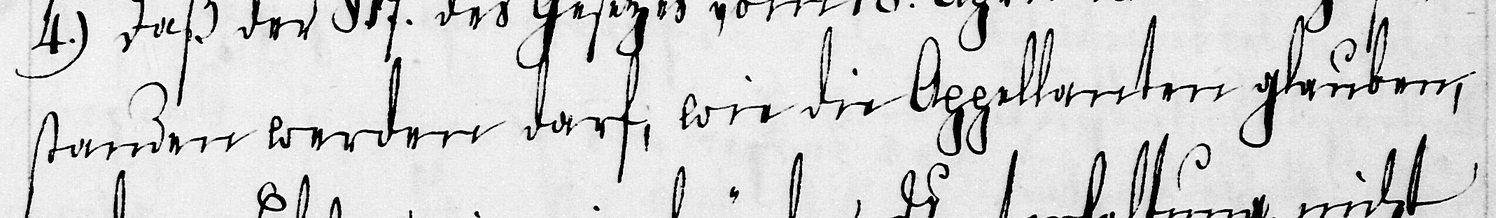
standen werden darf, wie die Appellanten glauben,
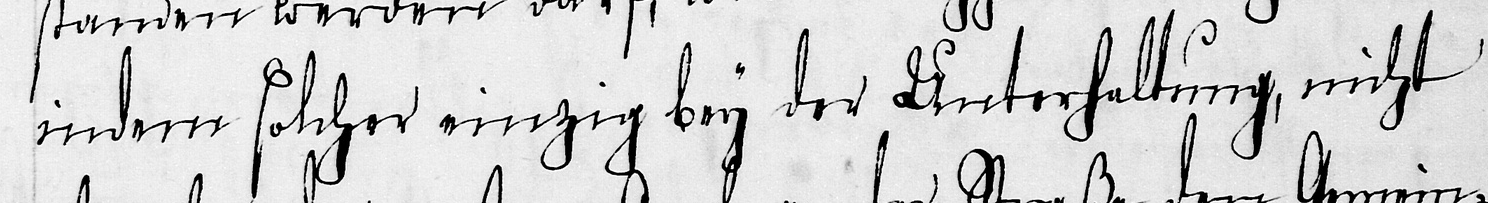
indem solcher einzig bey der Unterhaltung, nicht
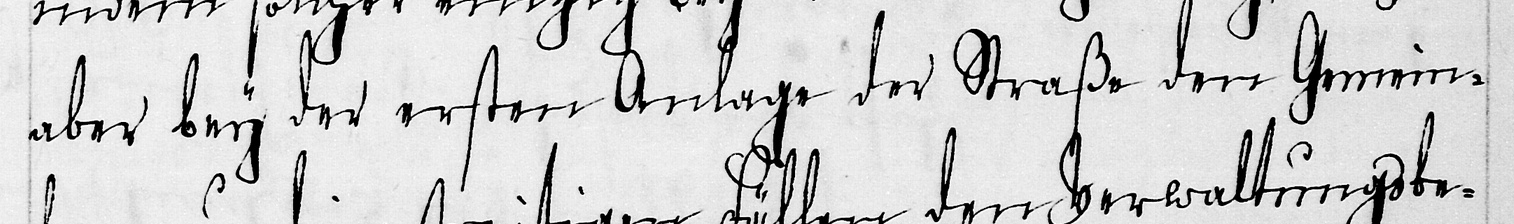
aber bey der ersten Anlage der Straße den Gemein¬
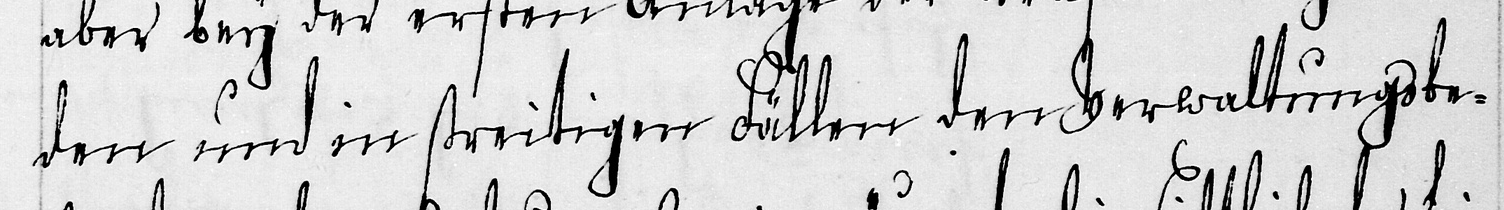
den und in streitigen Fällen den Verwaltungsbe¬
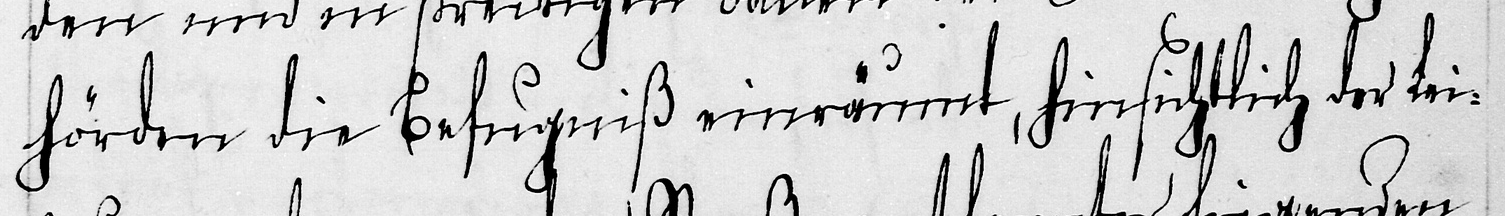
hörden die Befugniß einräumt, hinsichtlich der Le¬
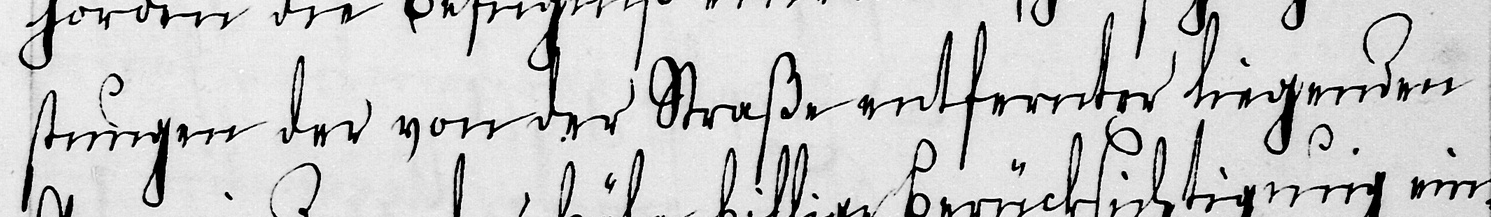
stungen der von der Straße entfernter liegenden
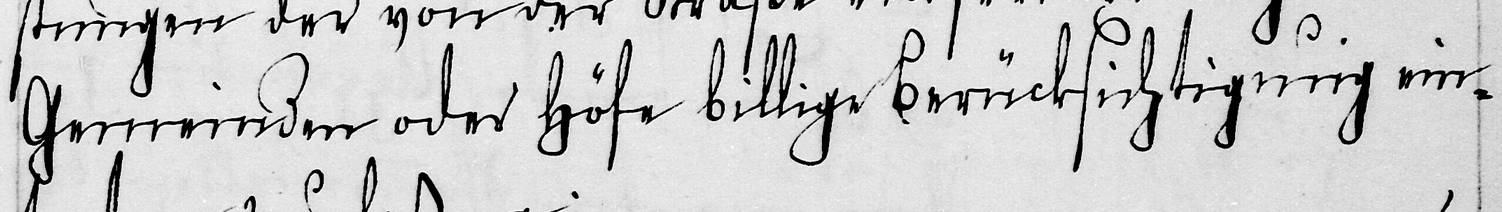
Gemeinden oder Höfe billige Berücksichtigung ein¬
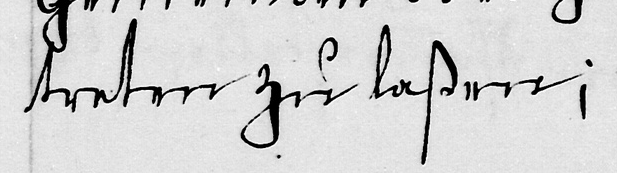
treten zu laßen;
